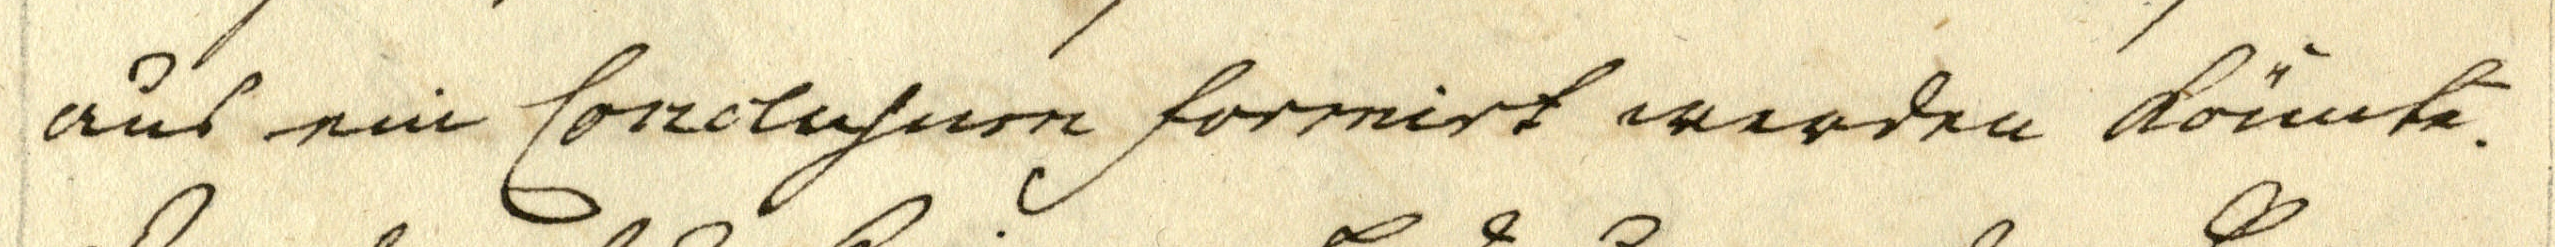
aus ein Conclusum formirt werden könnte.
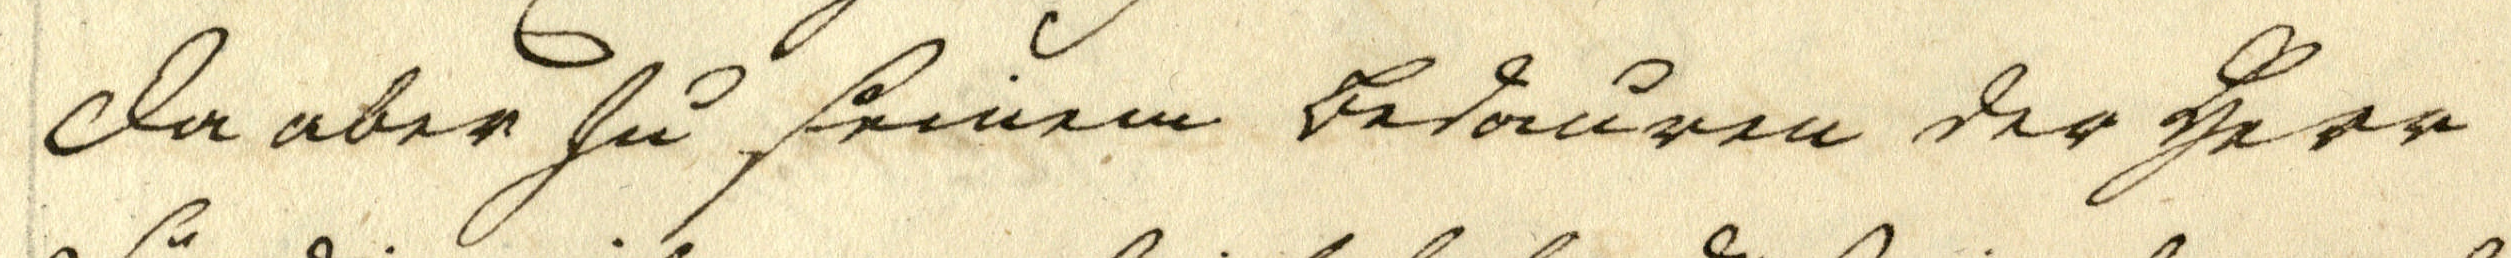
Da aber zu seinem Bedauren der Herr
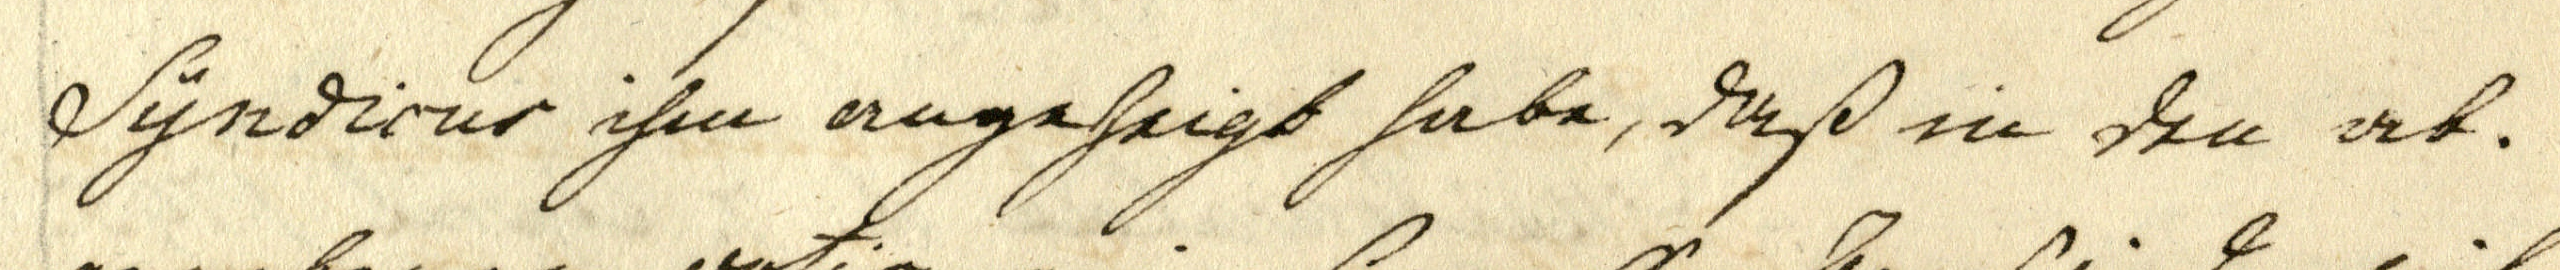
Sÿndicus ihm angezeigt habe, daß in den ab¬
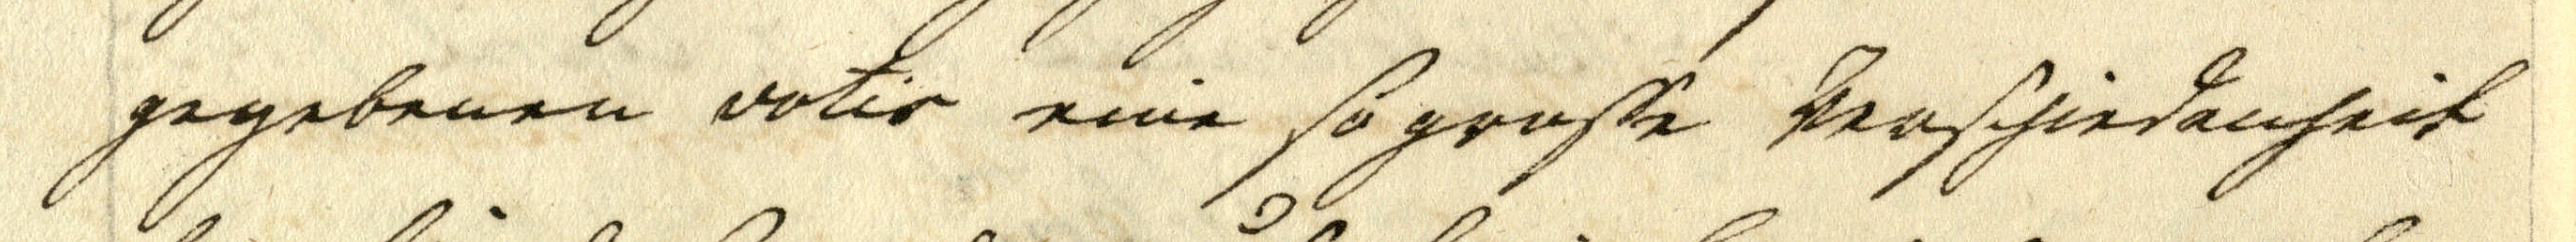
gegebenen votis eine so grosse Verschiedenheit
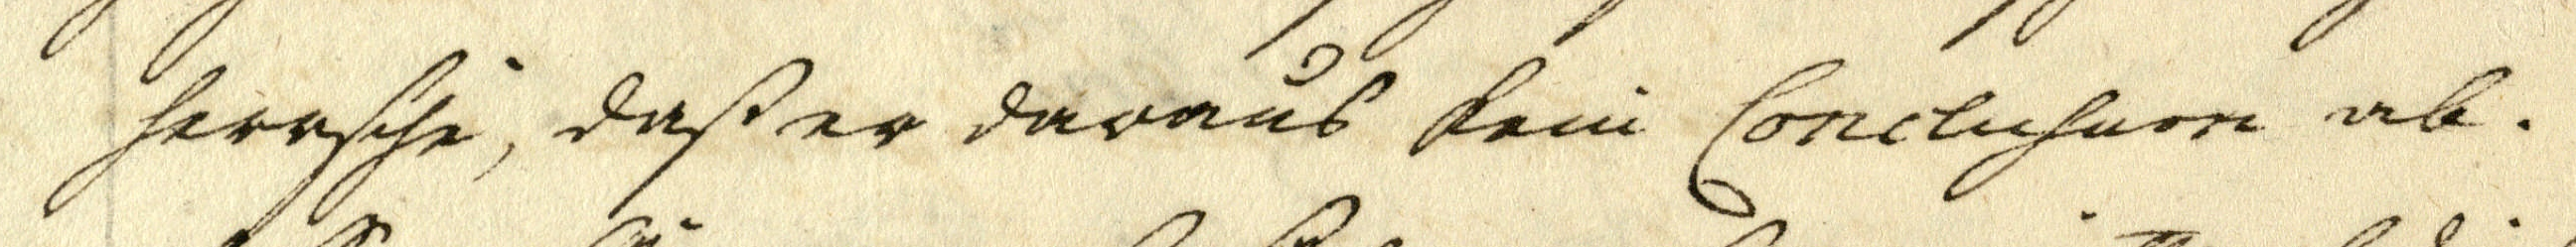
herrsche, daß er daraus kein Conclusum ab¬
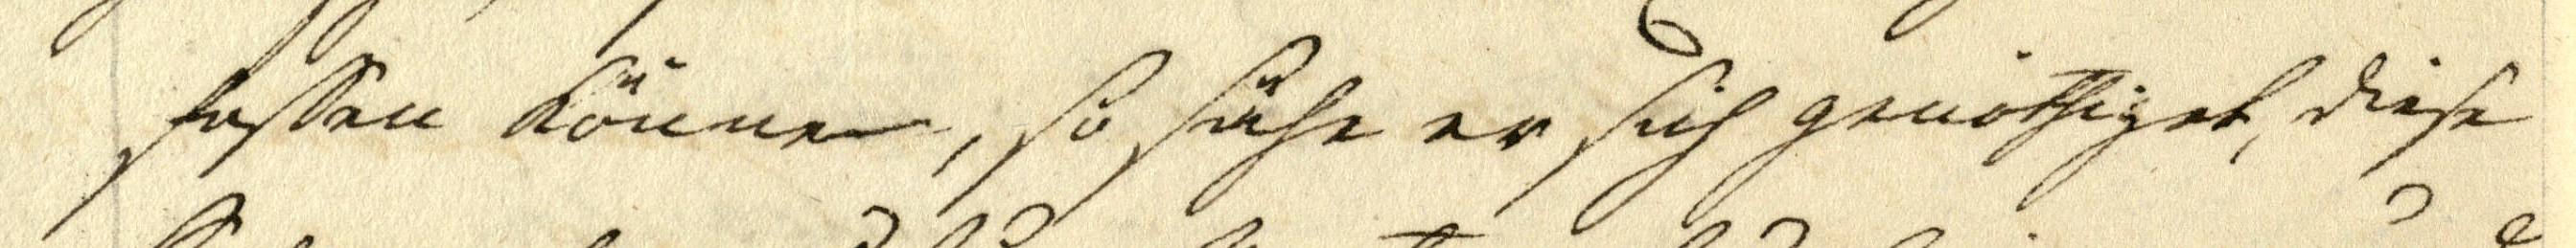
fassen können, so sähe er sich genöthiget, diese
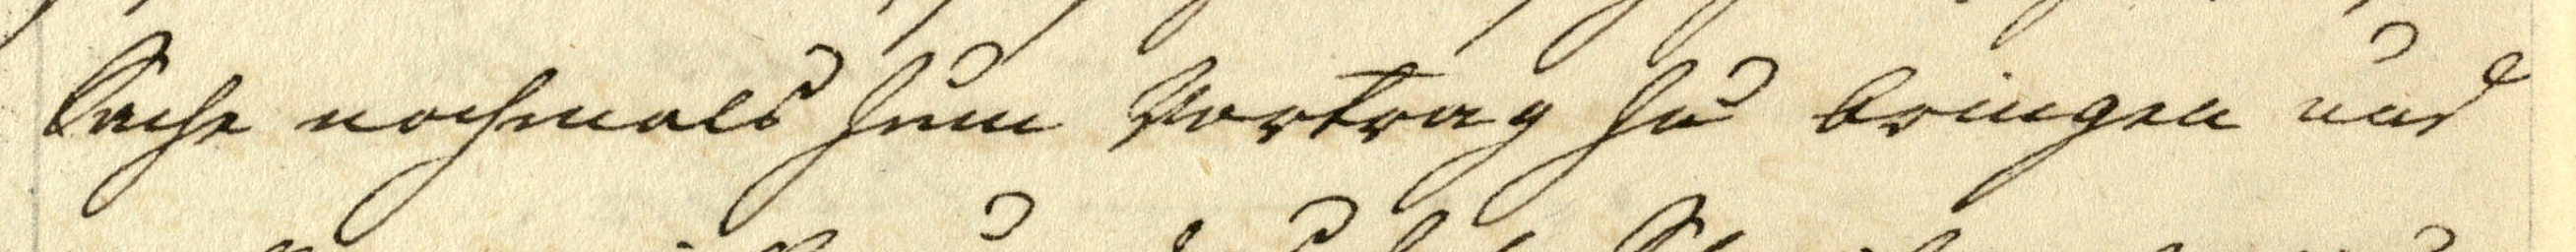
Sache nochmals zum Vortrag zu bringen und
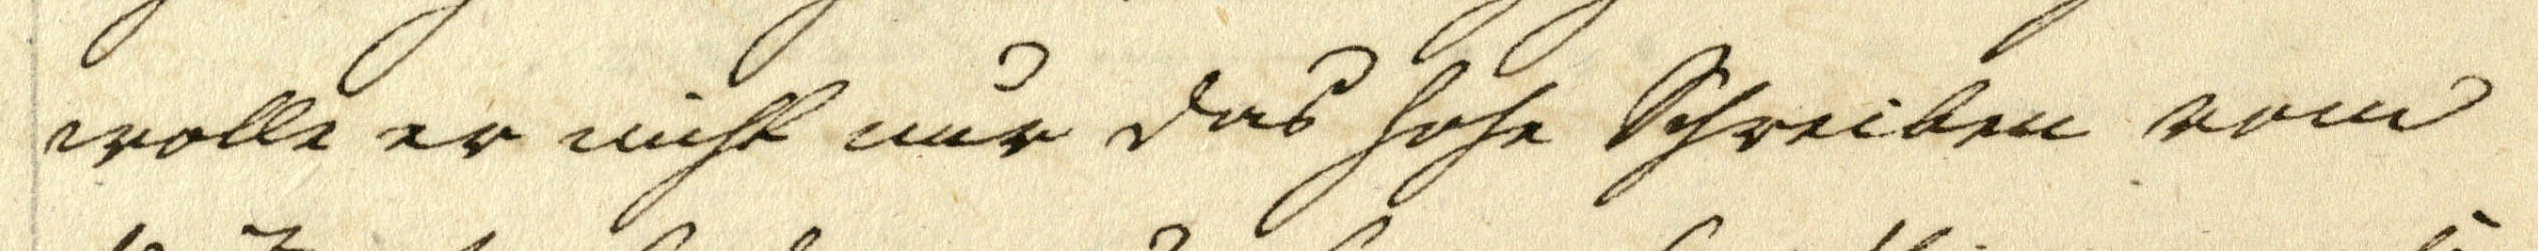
wolle er nicht nur das hohe Schreiben vom
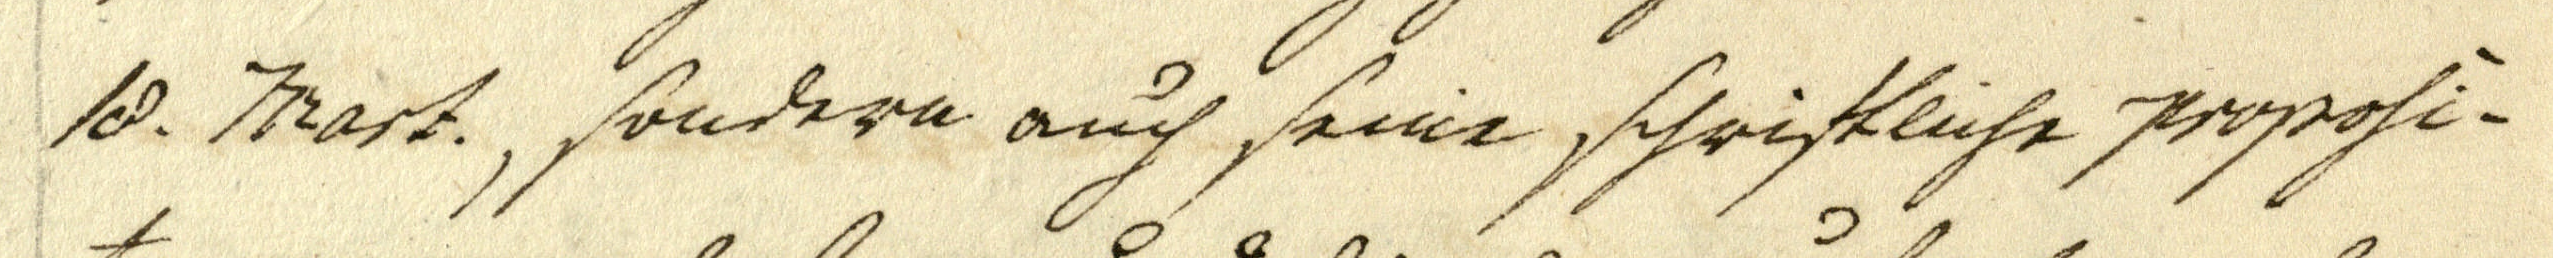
18. Mart., sondern auch seine schriftliche proposi-
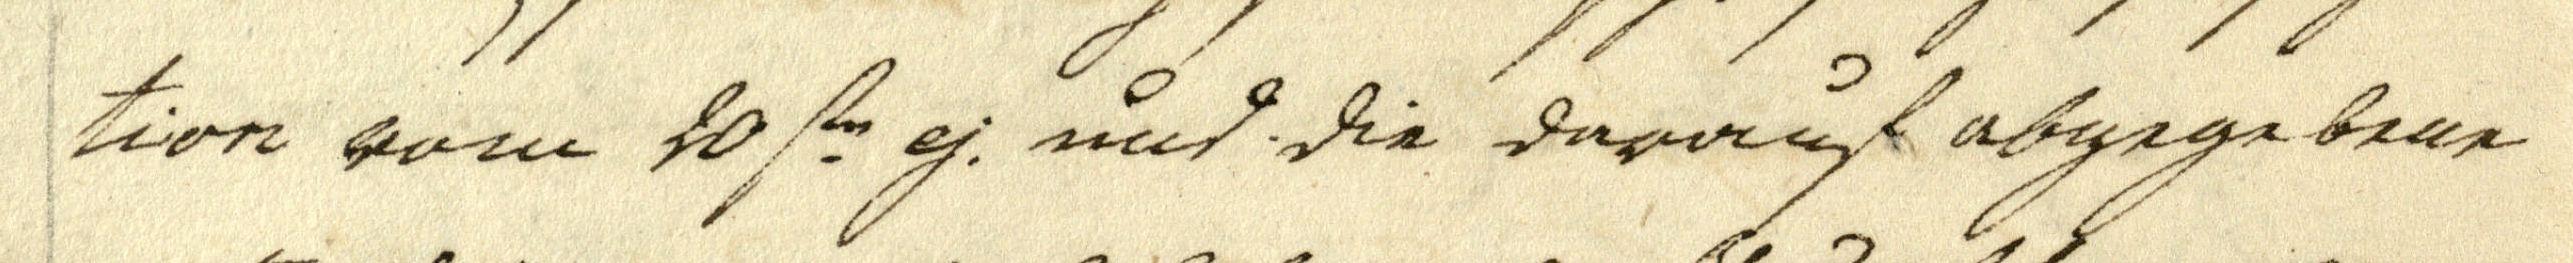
tion vom 20 ten ej. und die darauf abgegebene
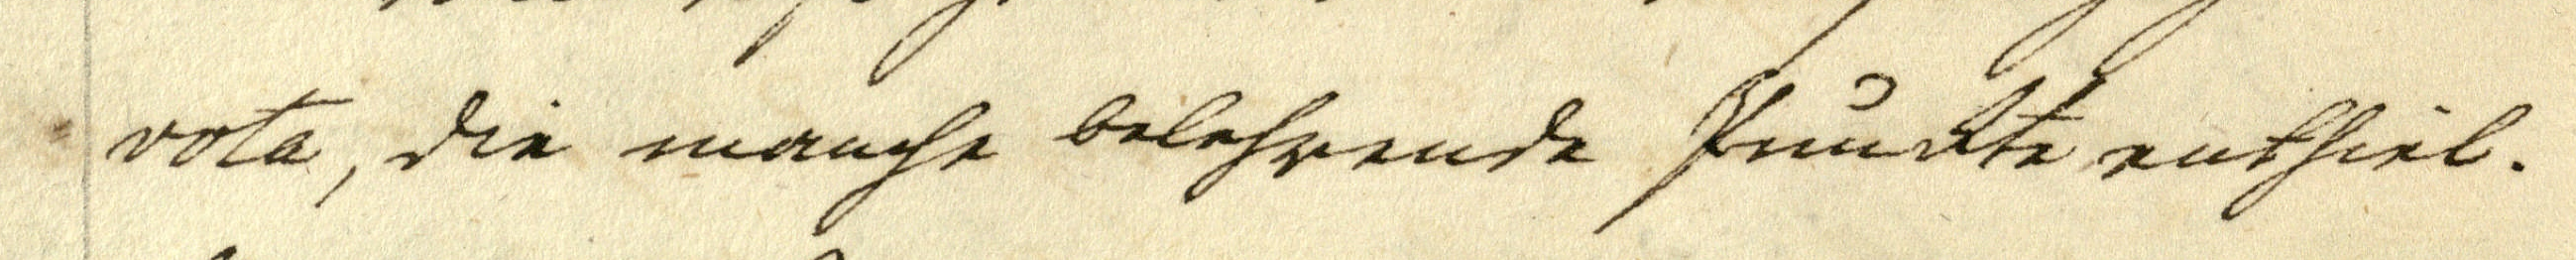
vota, die manche belehrende Punckte enthiel¬
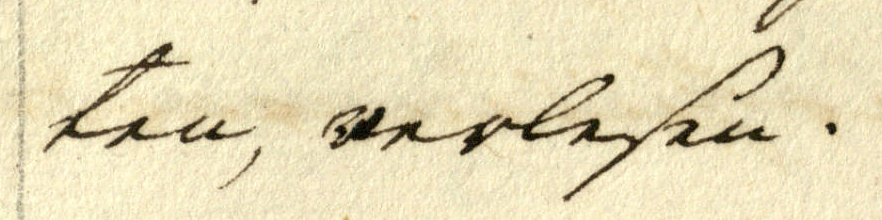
ten, verlesen.
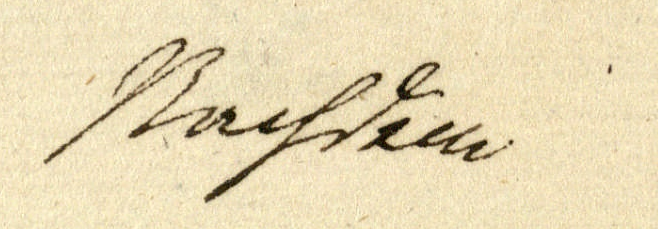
Nachdem
